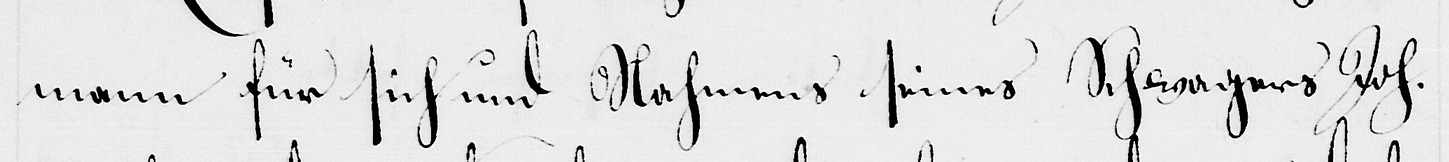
mann für sich und Nahmens seines Schwagers Joh.
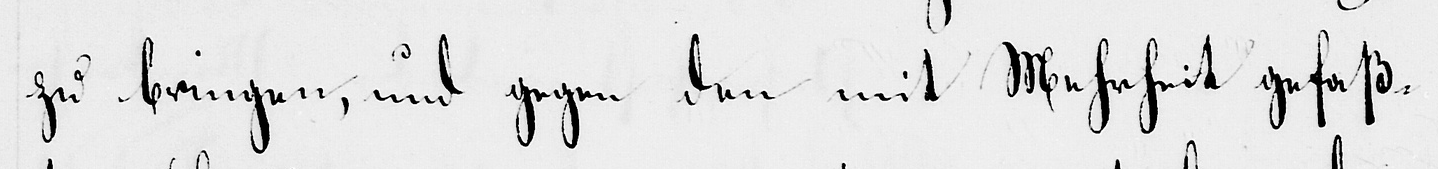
zu bringen, und gegen den mit Mehrheit gefaß¬
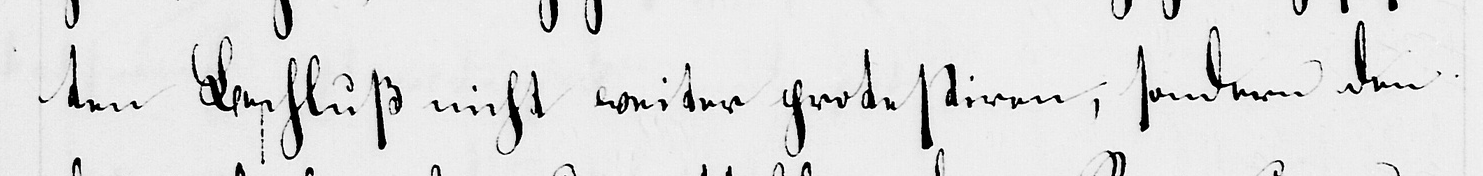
ten Beschluß nicht weiter protestiren, sondern den
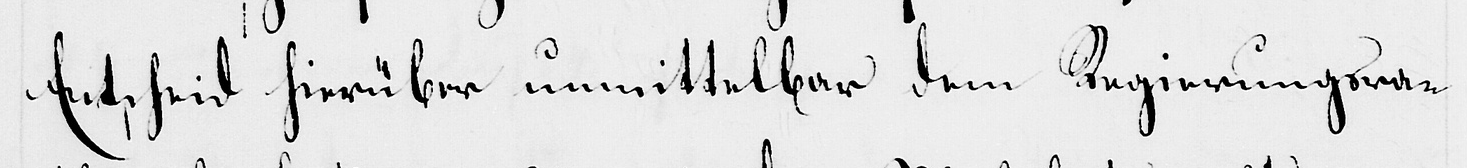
Entscheid hierüber unmittelbar dem Regierungsra¬
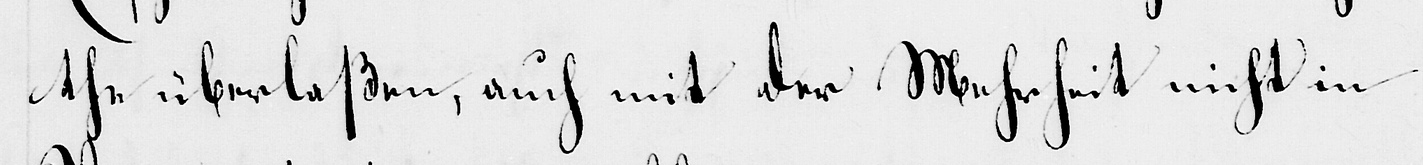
the überlaßen, auch mit der Mehrheit nicht in
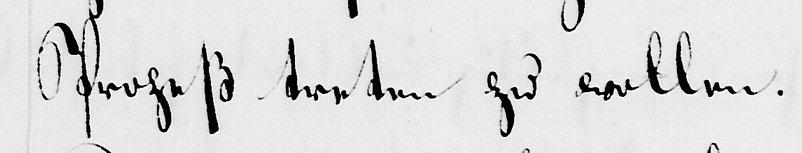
Prozeß treten zu wollen.
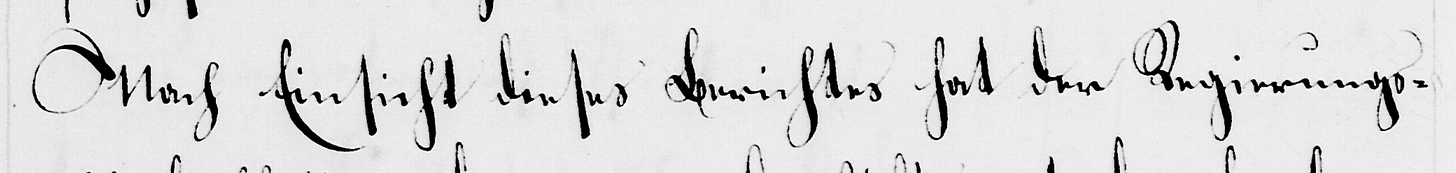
Nach Einsicht dieses Berichtes hat der Regierungs¬
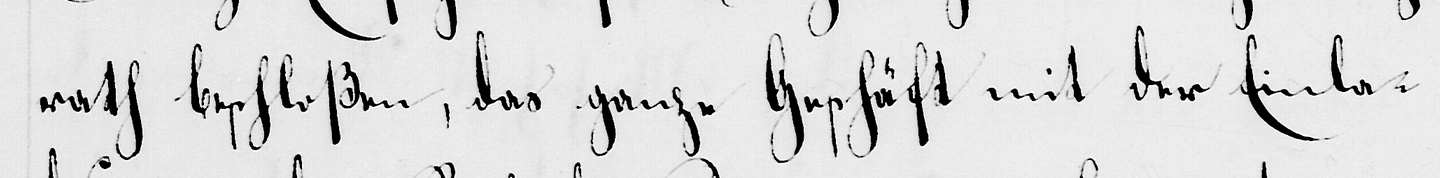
rath beschloßen, das ganze Geschäft mit der Einla¬
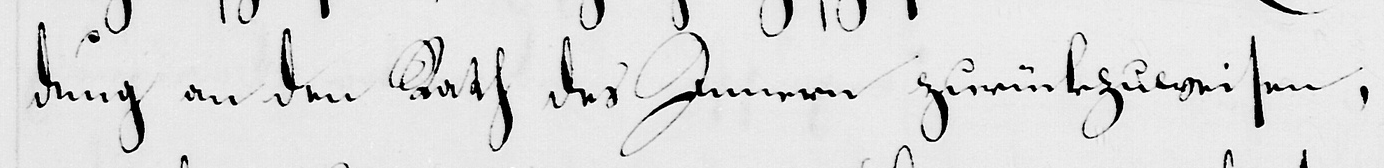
dung an den Rath des Innern zurückzuweisen,
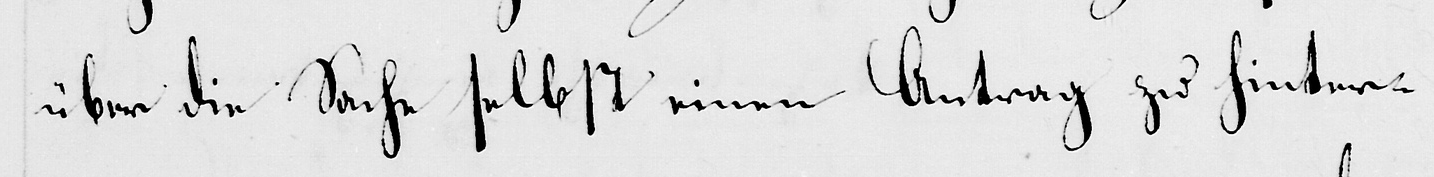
über die Sache selbst einen Antrag zu hinter-
